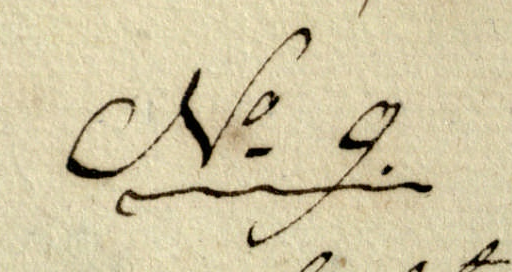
No 9.
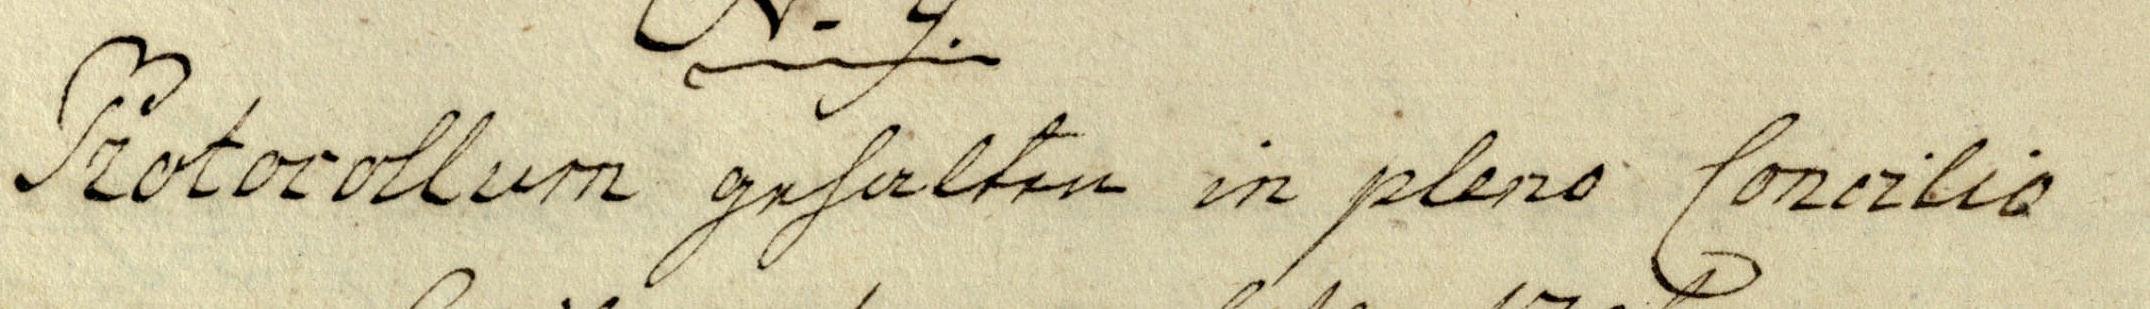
Protocollum gehalten in pleno Concilio
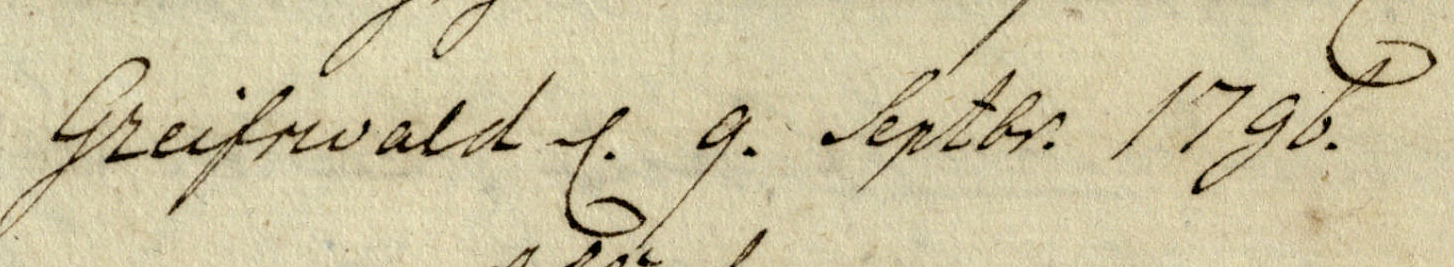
Greifswald d. 9. Septbr. 1796.
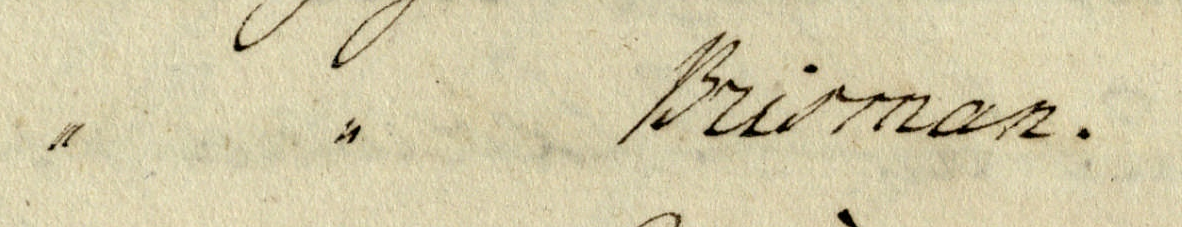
Brisman.
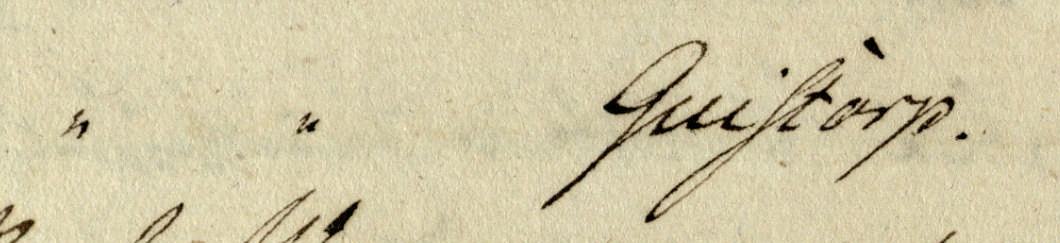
Quistorp.
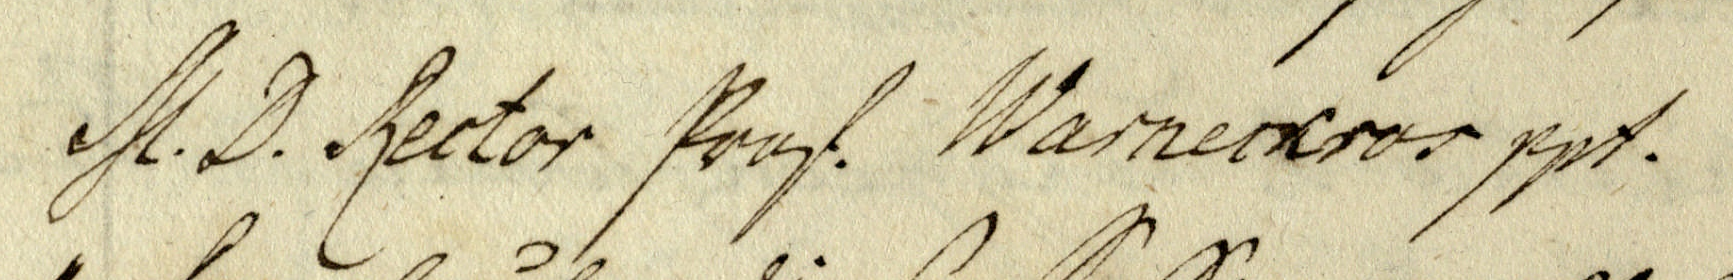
M. D. Rector Prof. Warneckros ppt.
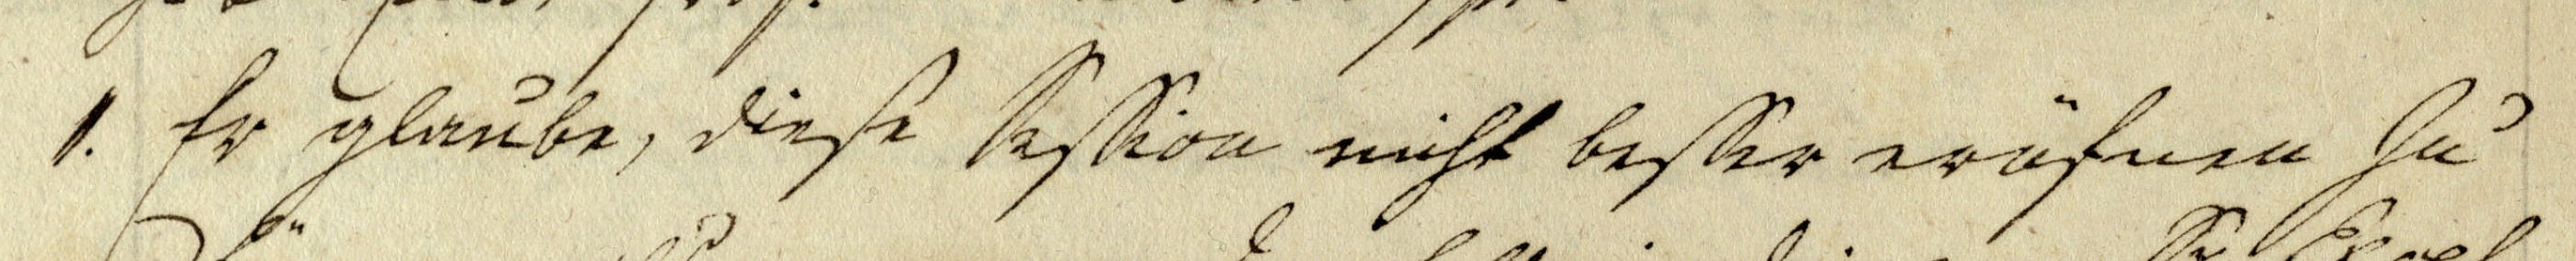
1. Er glaube, diese Session nicht besser eröfnen zu
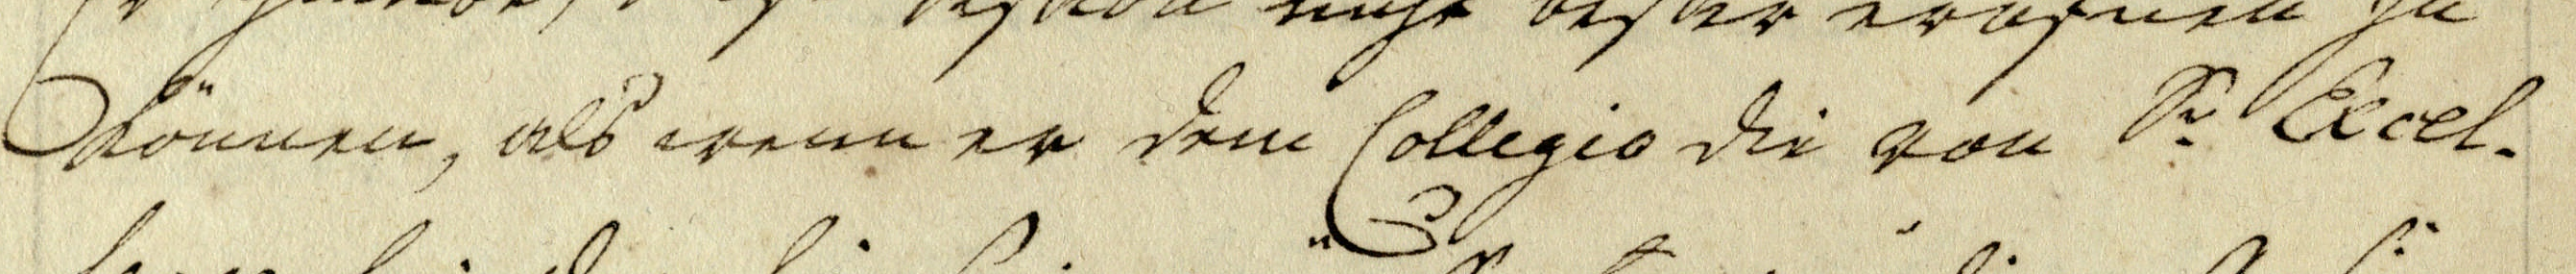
können, als wenn er dem Collegio die von Sr Excel¬
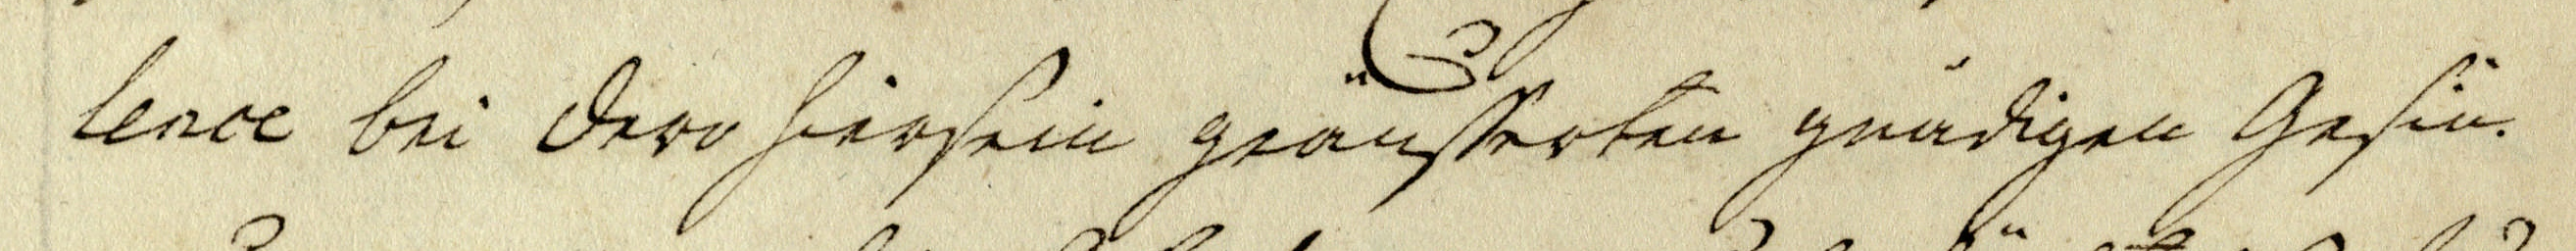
lence bei Dero hiersein geäusserten gnädige Gesin¬
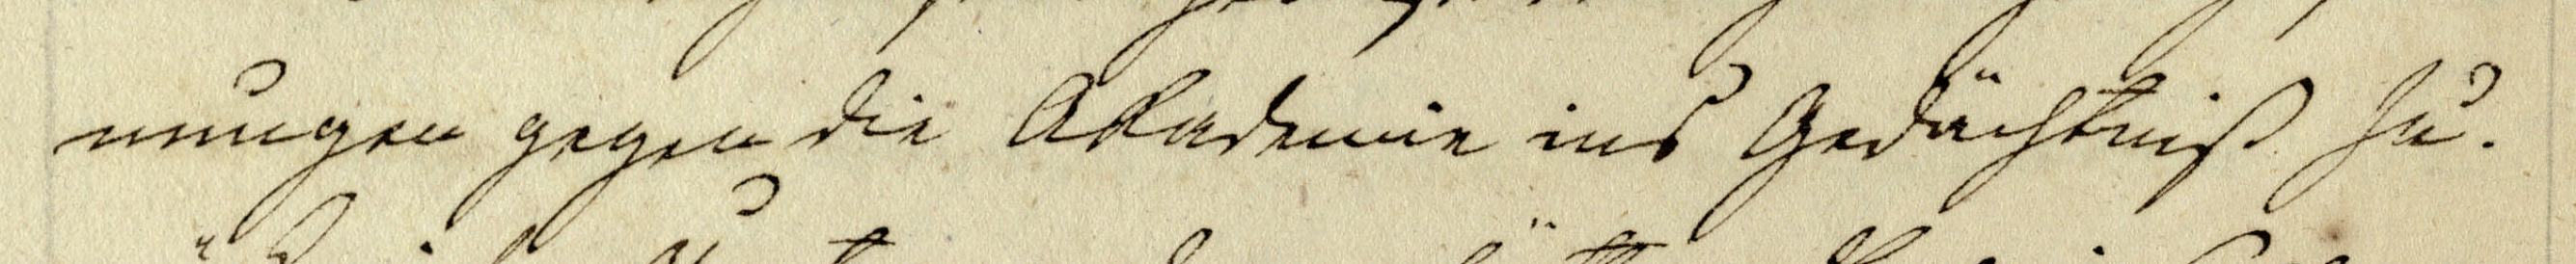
nungen gegen die Akademie ins Gedächtniß zu¬
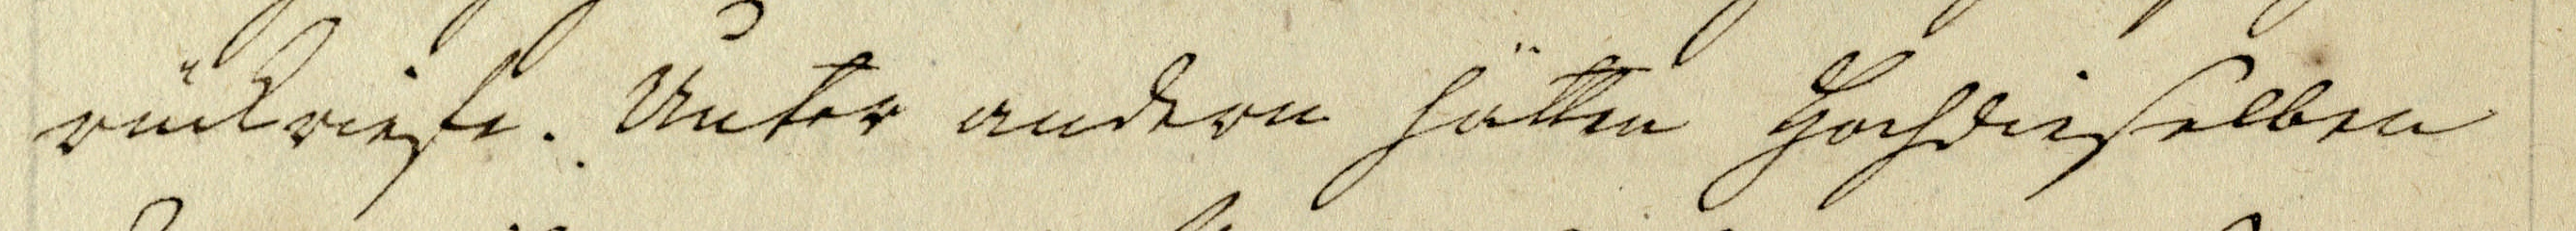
rückriefe. Unter andern hätten Hochdieselben
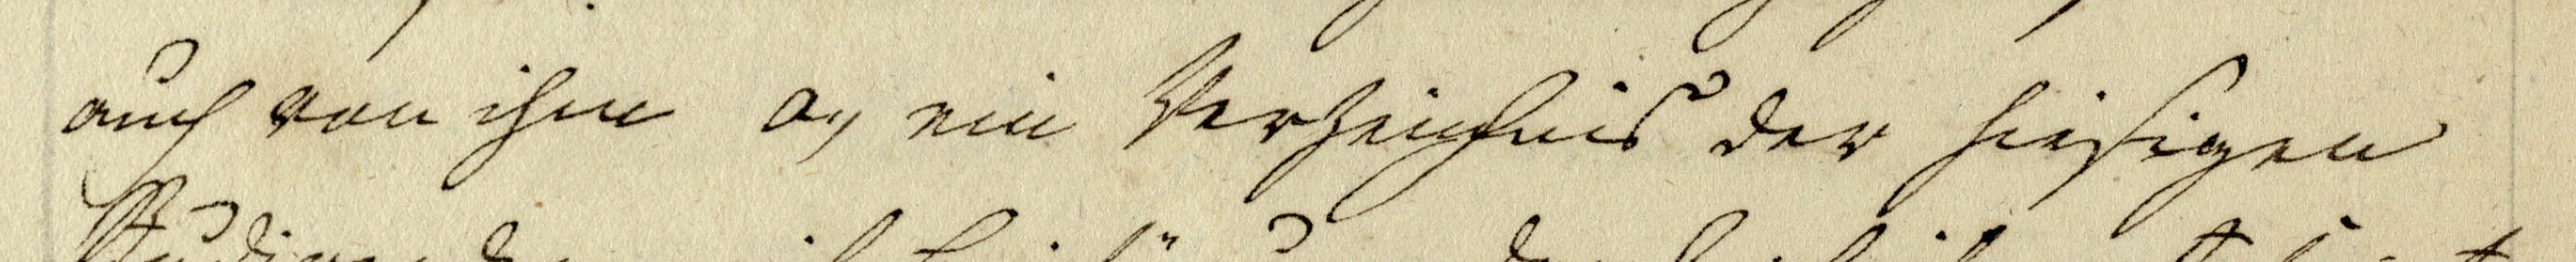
auch von ihm a., ein Verzeichnis der hiesigen
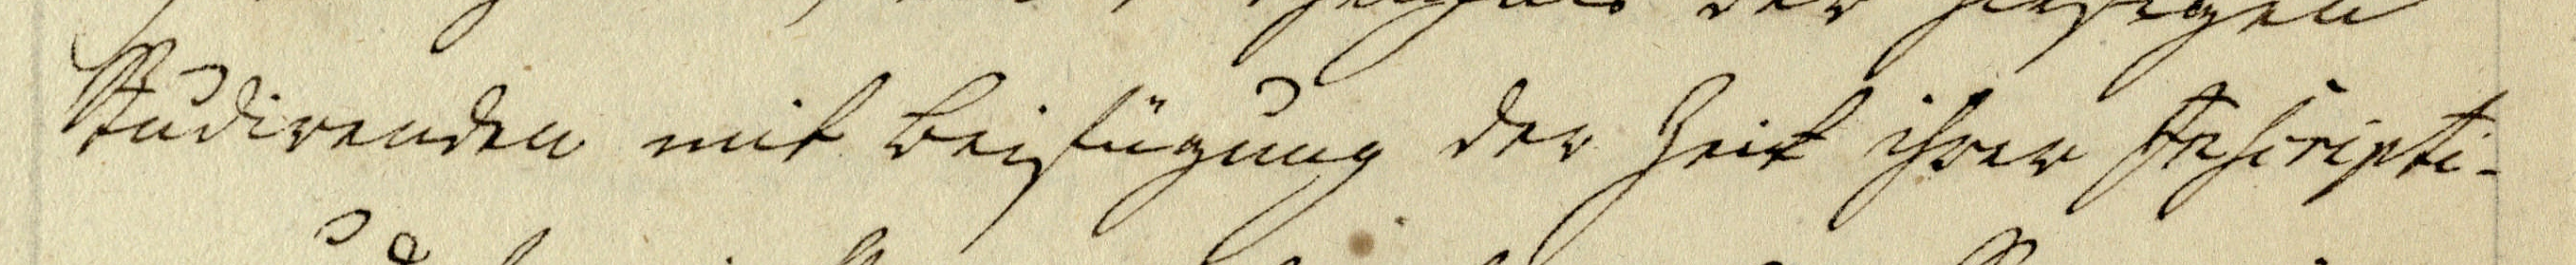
Studirenden mit Beifügung der Zeit ihrer Inscripti¬
